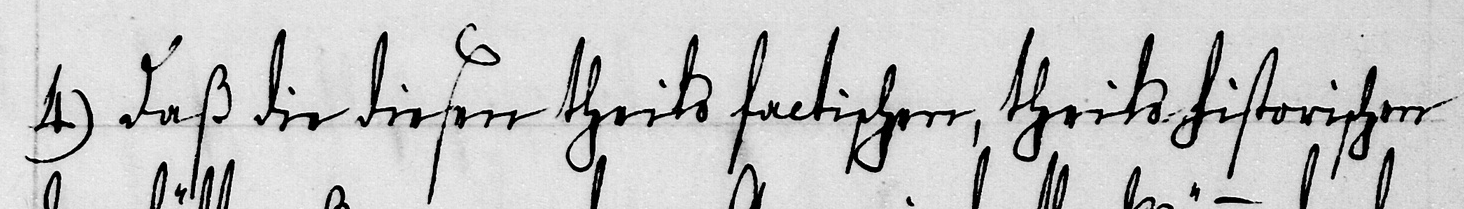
4.) Daß die diesen theils factischen, theils historischen
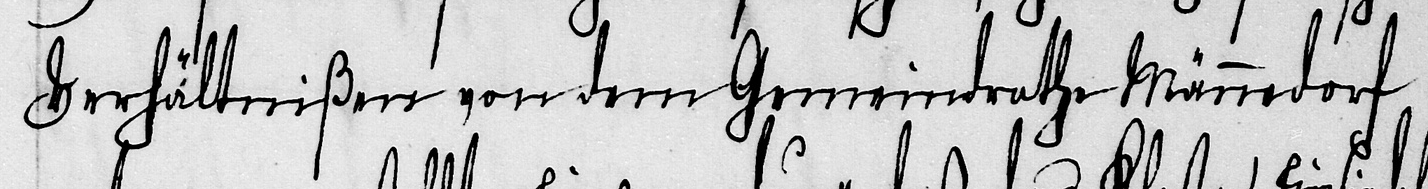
Verhältnißen von dem Gemeindrathe Männedorf
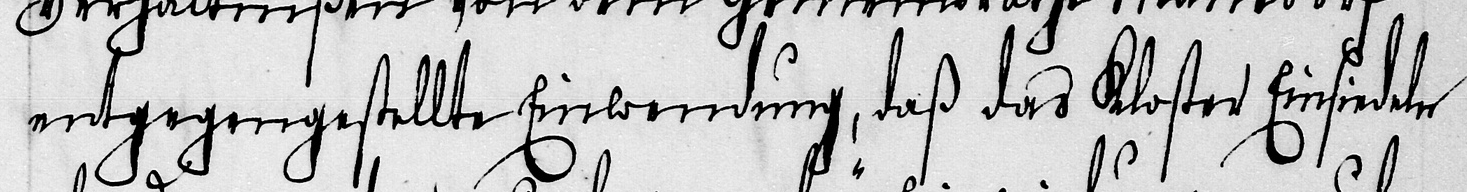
entgegengestellte Einwendung, daß das Kloster Einsiedeln
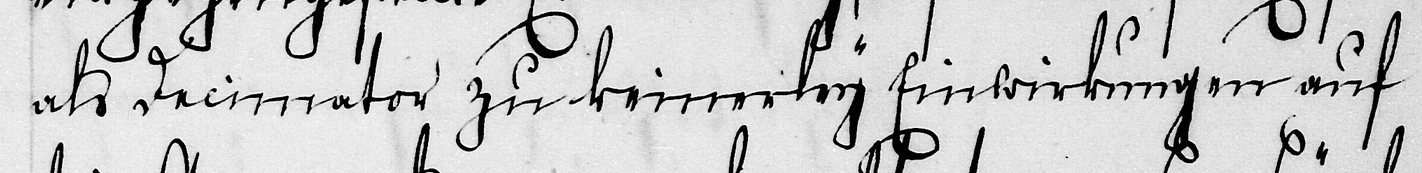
als Decimator zu keinerley Einwirkungen auf
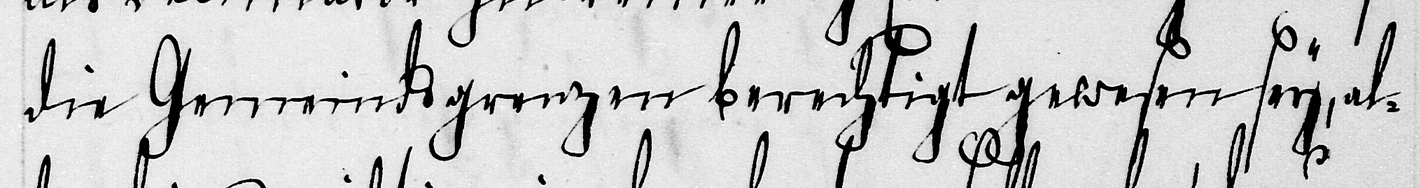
die Gemeindsgrenzen berechtigt gewesen sey, al¬
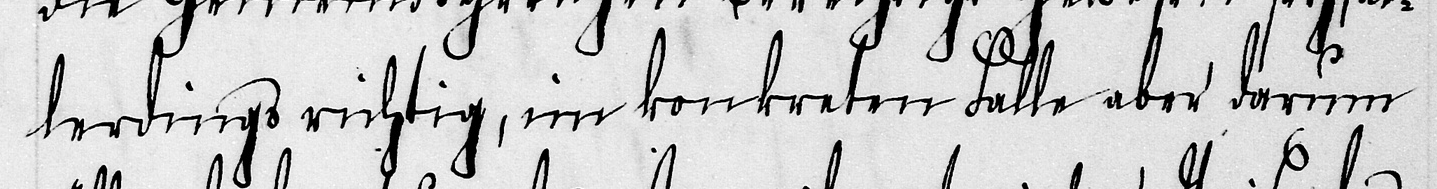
lerdings richtig, im konkreten Falle aber darum
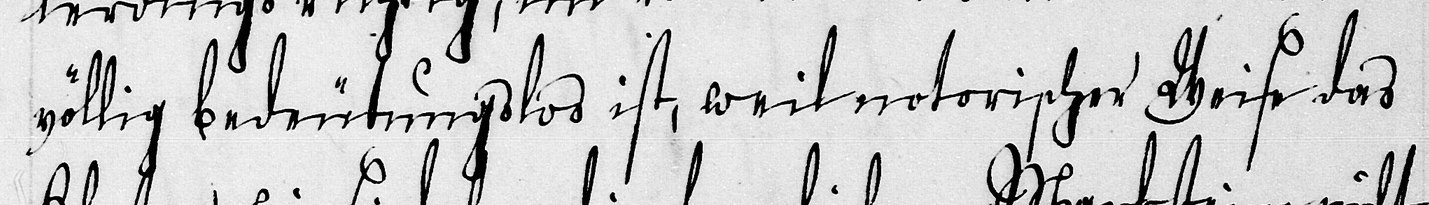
völlig bedeutungslos ist, weil notorischer Weise das
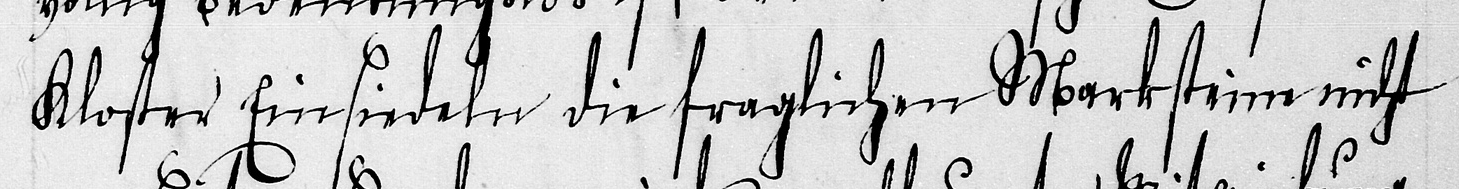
Kloster Einsiedeln die fraglichen Marksteine nicht
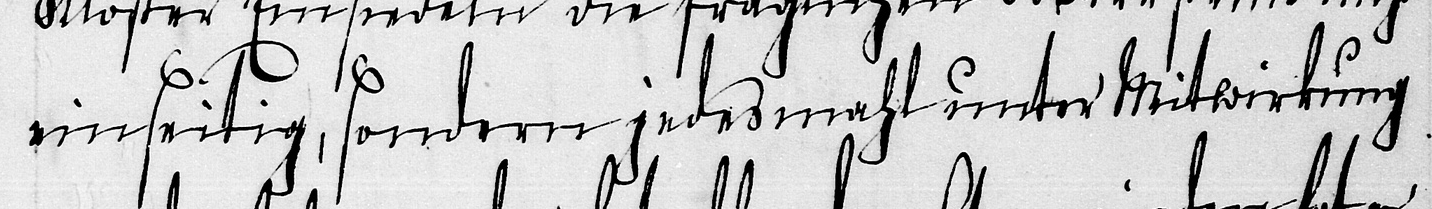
einseitig, sondern jedesmahl unter Mitwirkung
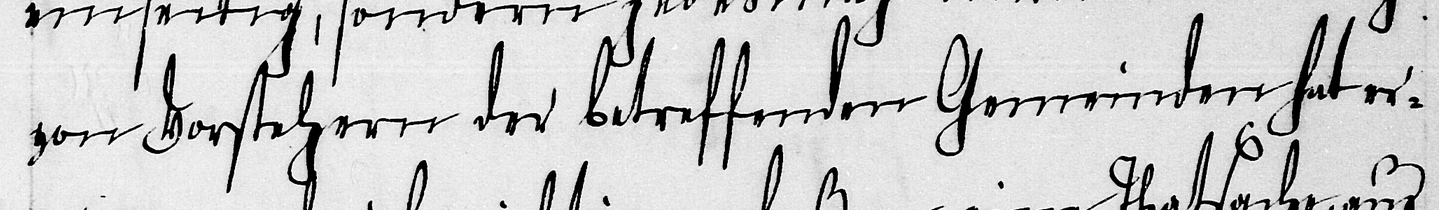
von Vorstehern der betreffenden Gemeinden hat er¬
